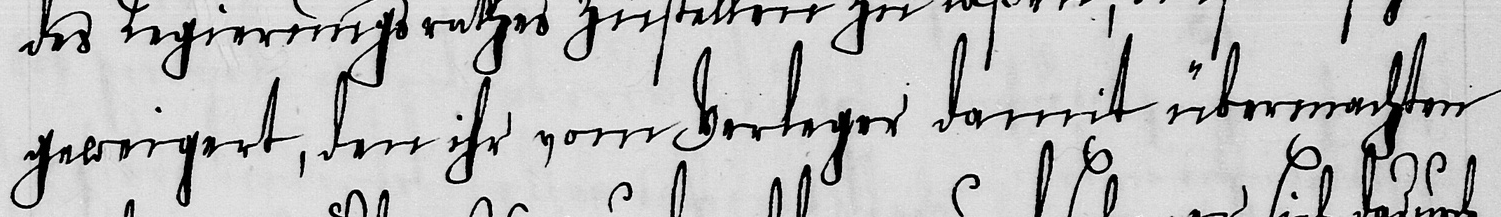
geweigert, den ihr vom Verleger damit übermachten
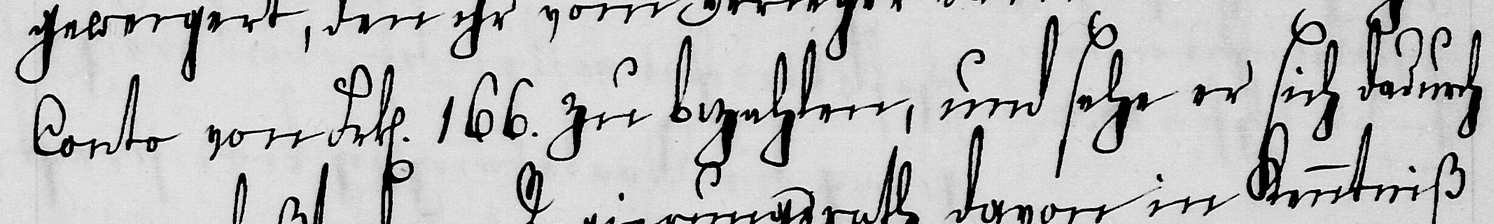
Conto von Frk[en]. 166 zu bezahlen, und sehe er sich dadur¬
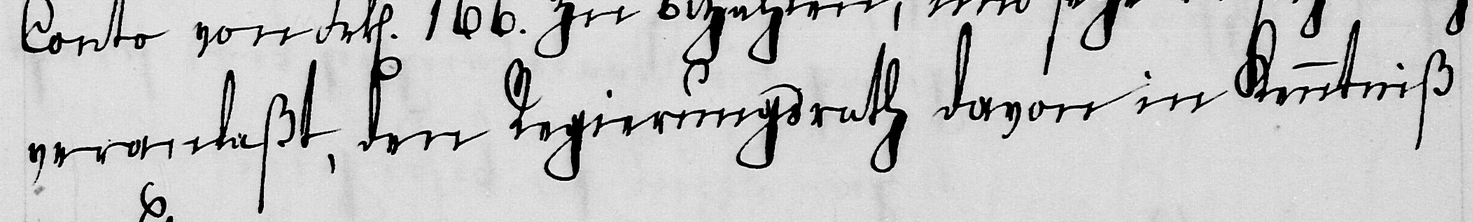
veranlaßt, den Regierungsrath davon in Kenntniß
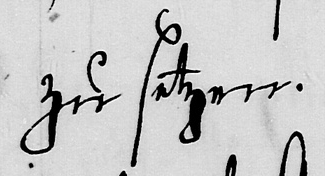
zu setzen.
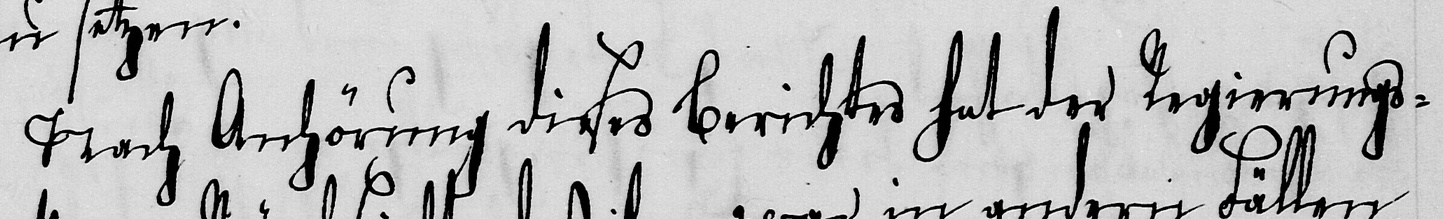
Nach Anhörung dieses Berichtes hat der Regierungs¬
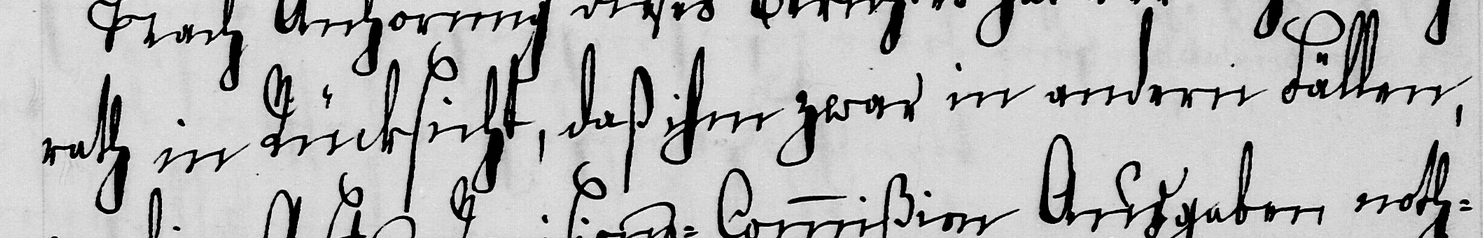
rath in Rücksicht, daß ihm zwar in andern Fällen,
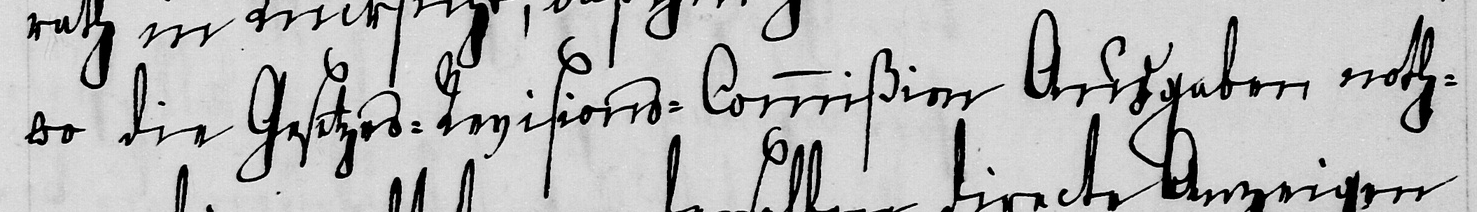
wo die Gesetzes-Revisions-Commißion Ausgaben noth¬
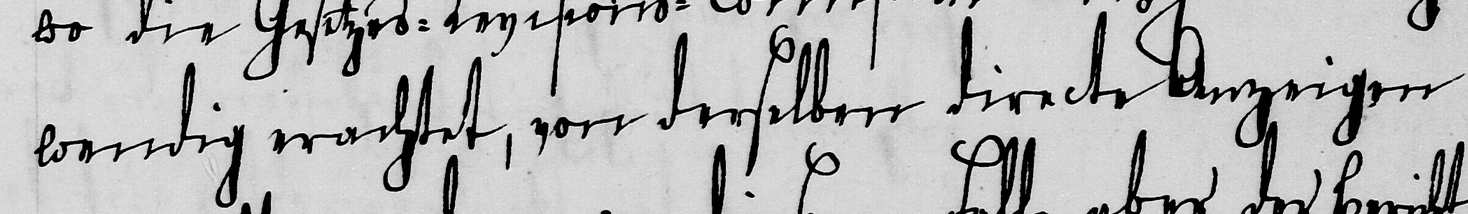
wendig erachtet, von derselben directe Anzeigen
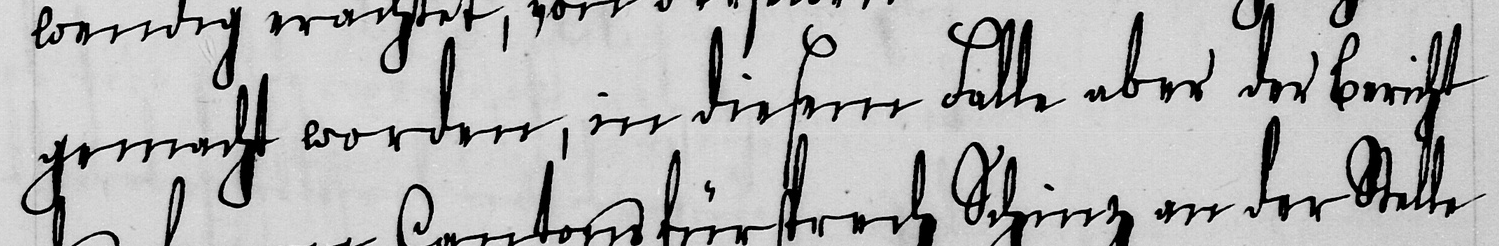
gemacht worden, in diesem Falle aber der Bericht
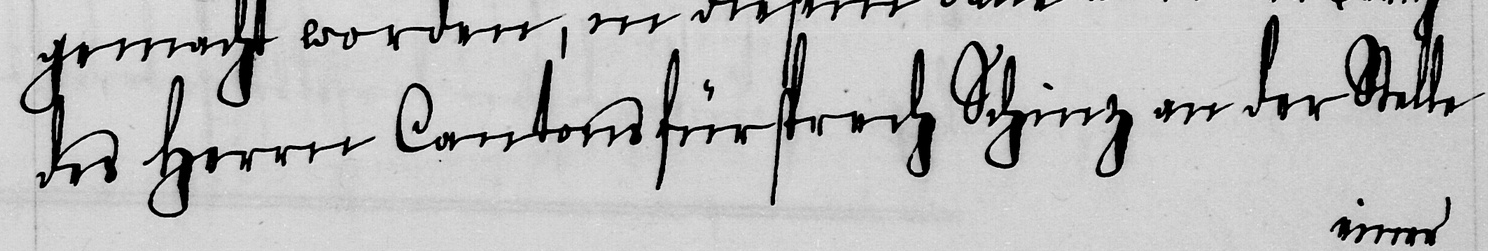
des Herrn Cantonsfürsprach Schinz an der Stelle
